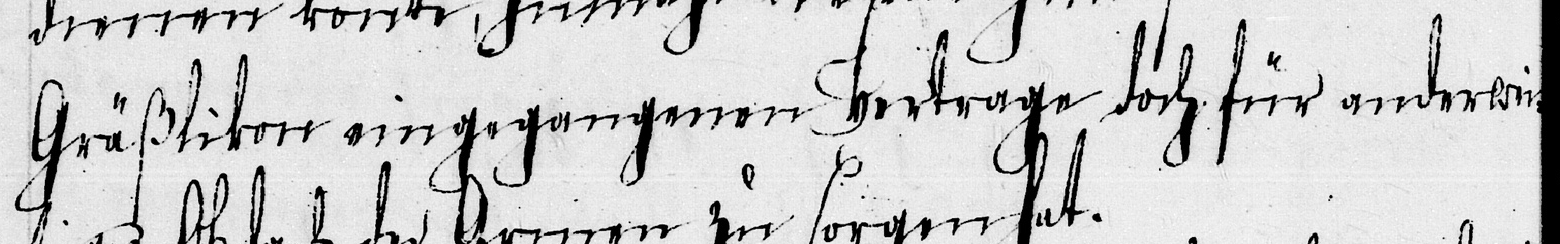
Gräßlikon eingegangenen Vertrage doch für anderwei¬
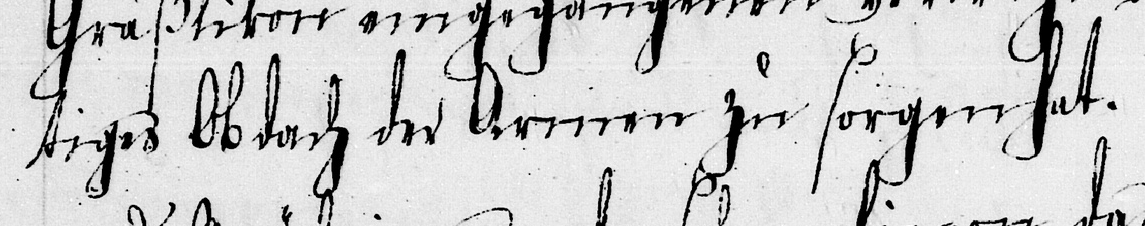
tiges Obdach der Armen zu sorgen hat.
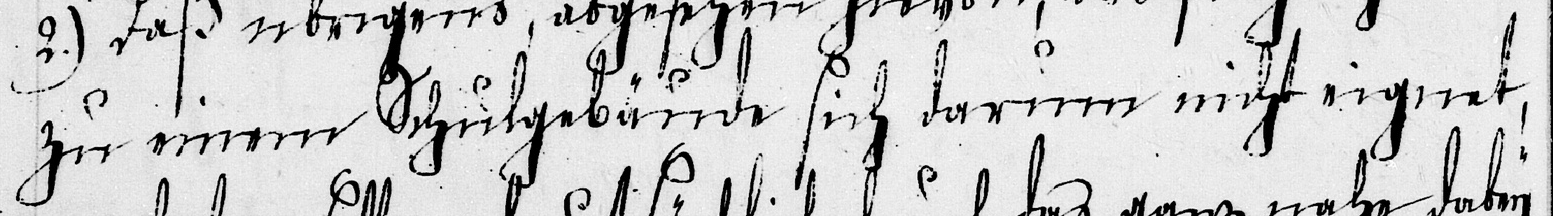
zu einem Schulgebäude sich darum nicht eignet,
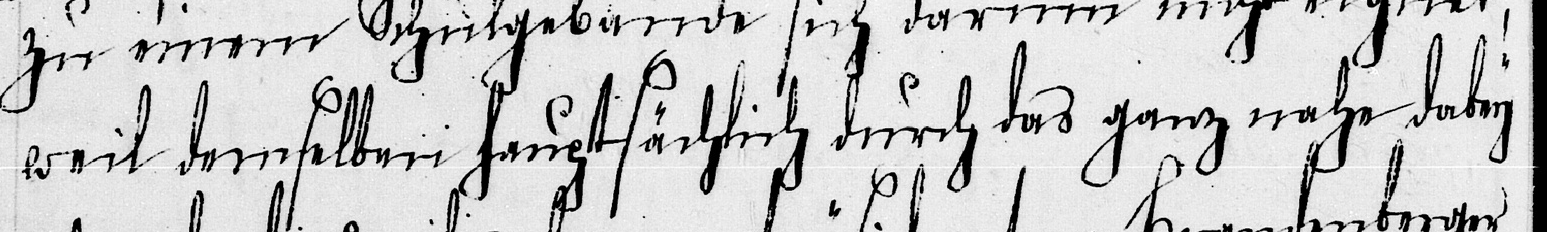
weil demselben hauptsächlich durch das ganz nahe dabey
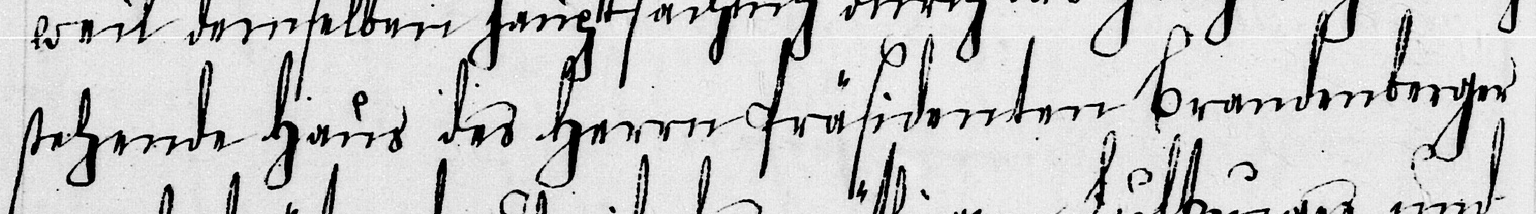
stehende Haus des Herrn Präsidenten Brandenberger
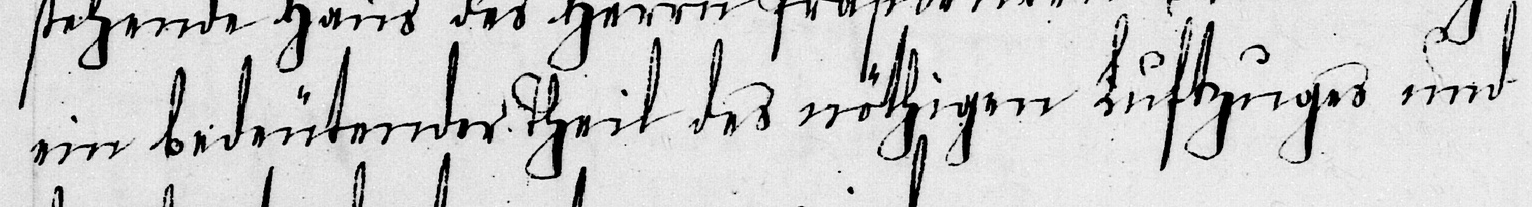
ein bedeutender Theil des nöthigen Luftzuges und
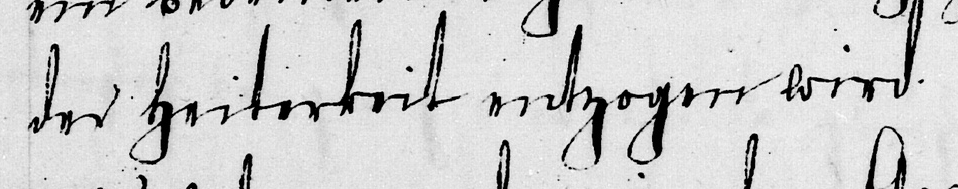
der Heiterkeit entzogen wird.
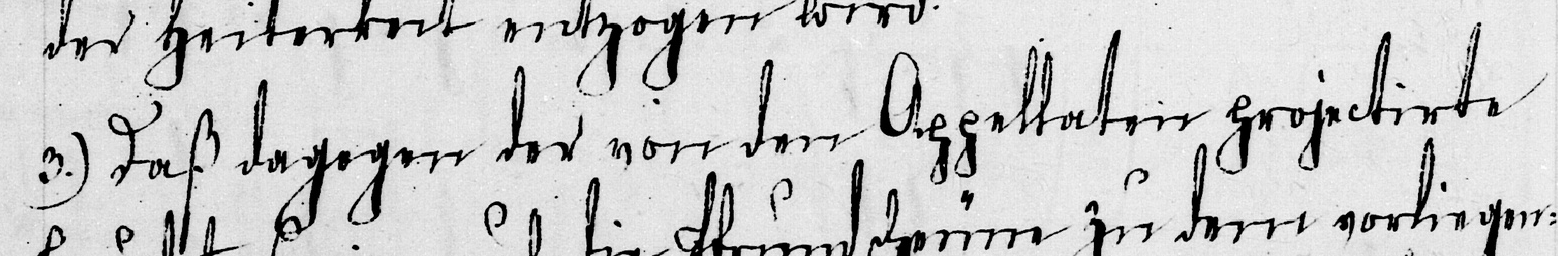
3.) Daß dagegen der von den Appellaten projectirte
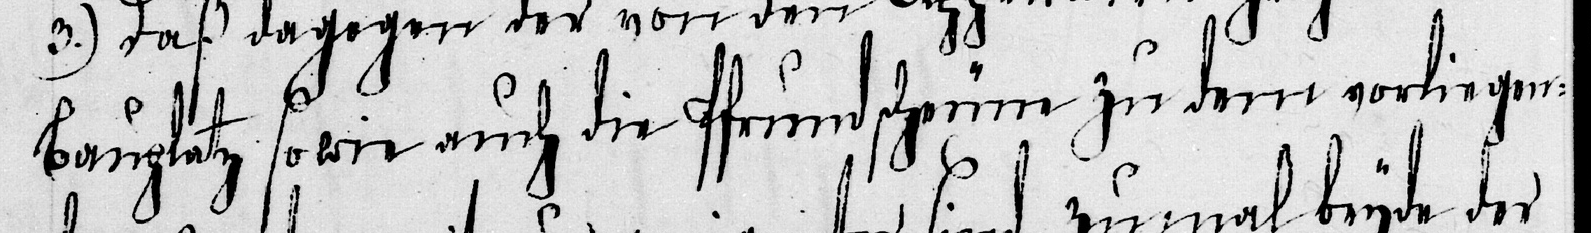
Bauplatz sowie auch die Pfrundscheune zu dem vorliegen¬
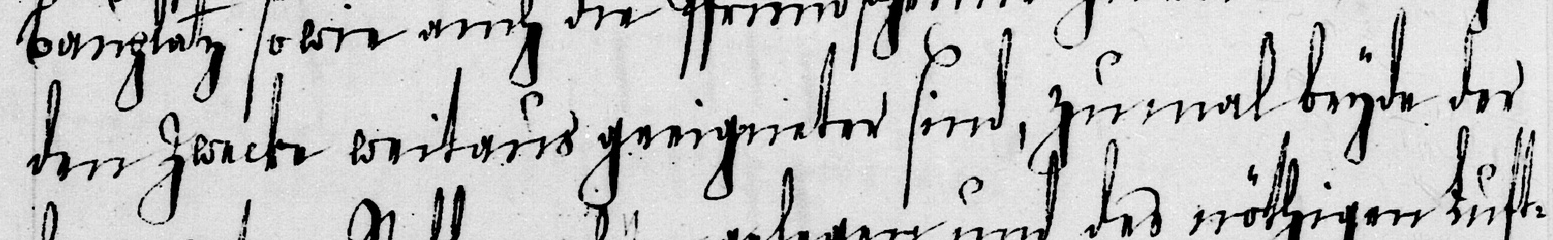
den Zwecke weitaus geeigneter sind, zumal beyde der
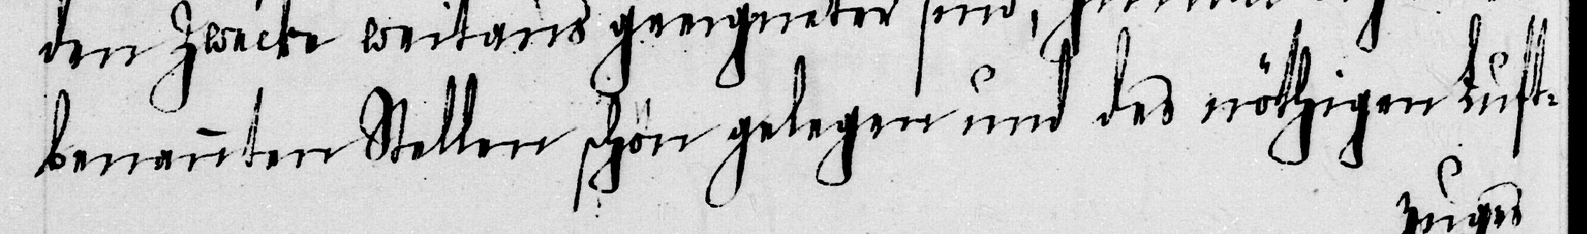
benannten Stellen schön gelegen und des nöthigen Luft-
